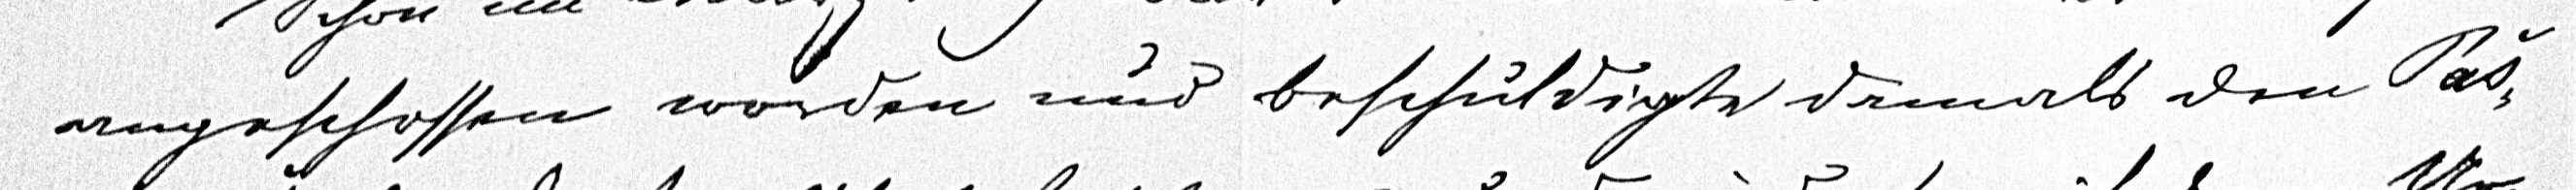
angeschossen worden und beschuldigte damals den Paš¬
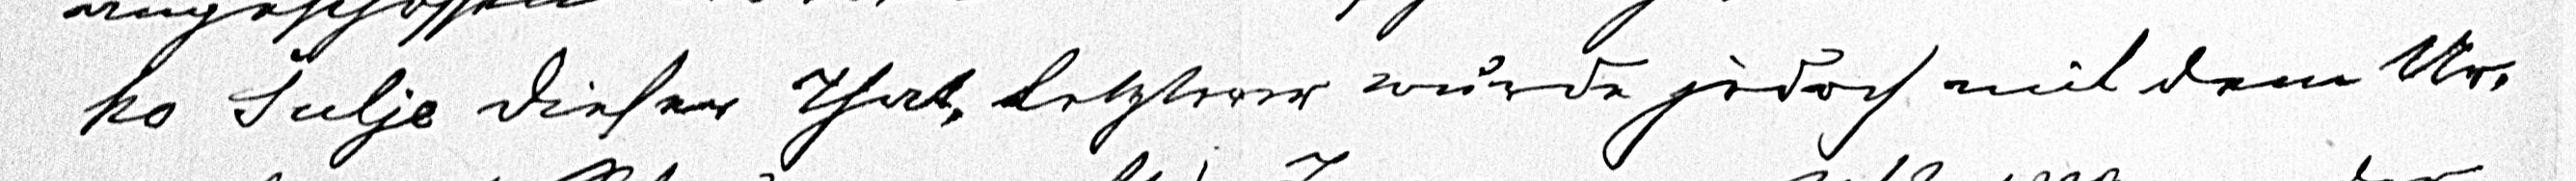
ko Šulje dieser That, letzterer wurde jedoch mit dem Ur¬
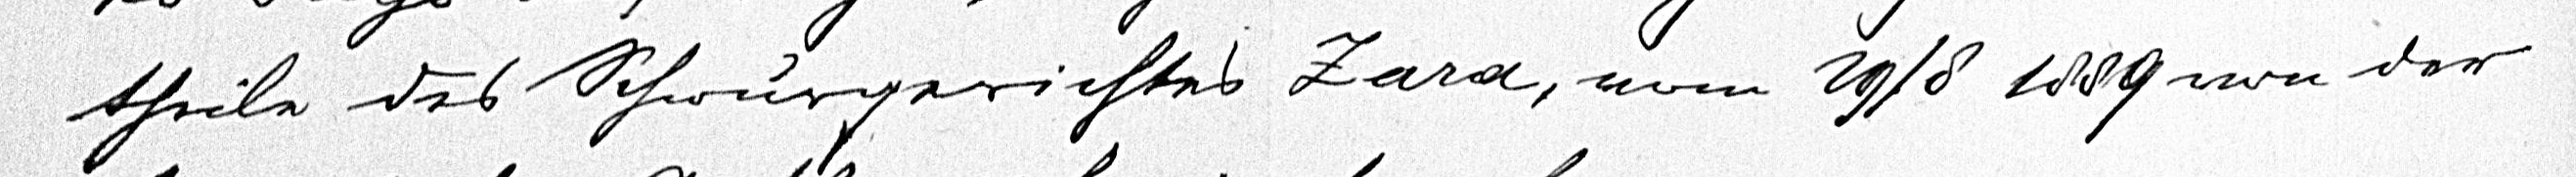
theilte des Schwurgerichtes Zara, vom 29/8 1889 von der
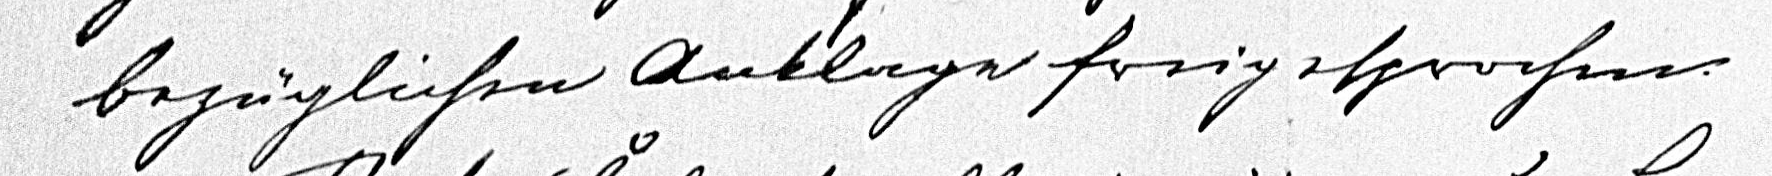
bezüglichen Anklage freigesprochen.
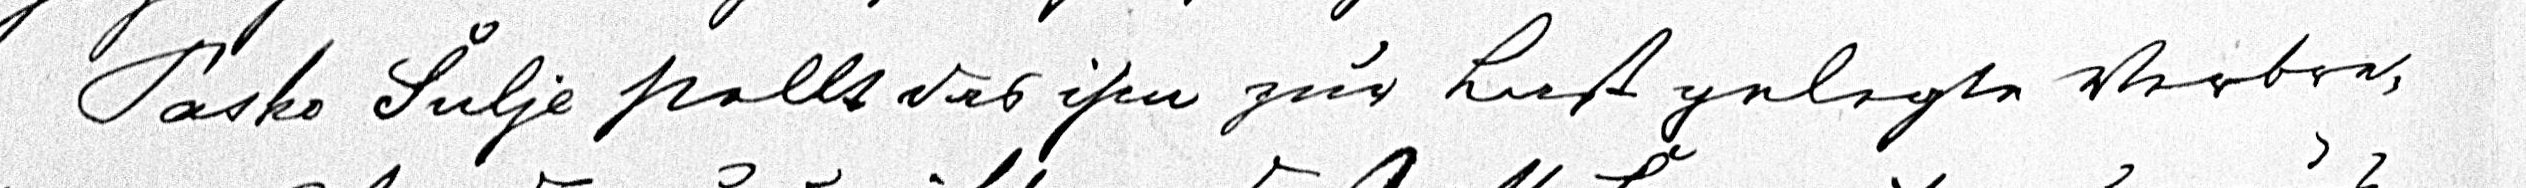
Pasko Šulje stellt das ihm zur Last gelegte Verbre¬
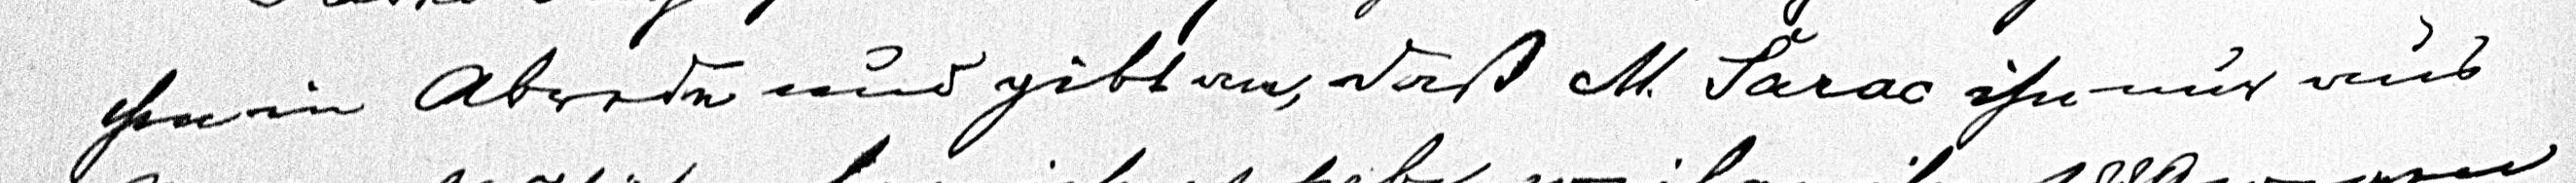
chen in Abrede und gibt an, daß M. Šarac ihn nur aus
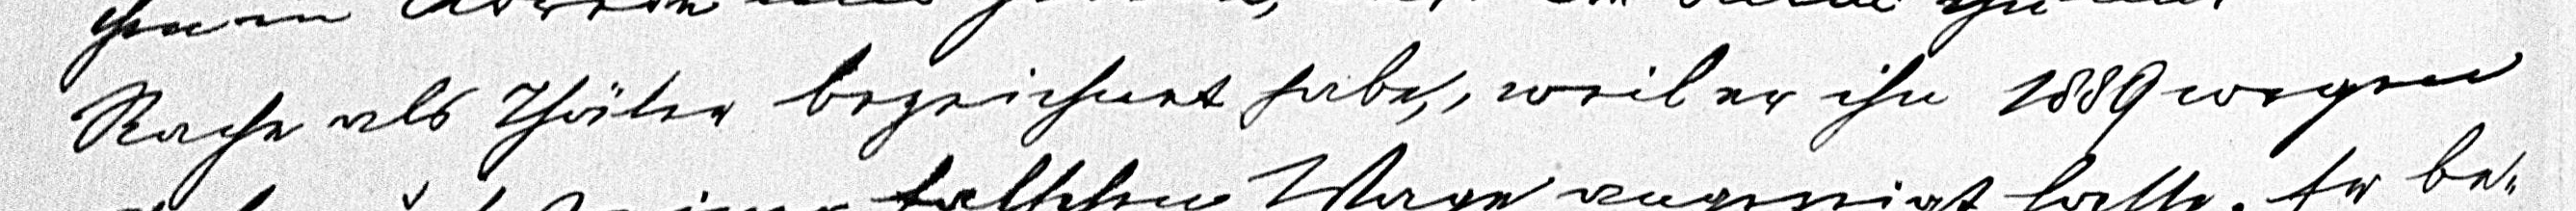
Rache als Thäter bezeichnet habe, weil er ihn 1889 wegen
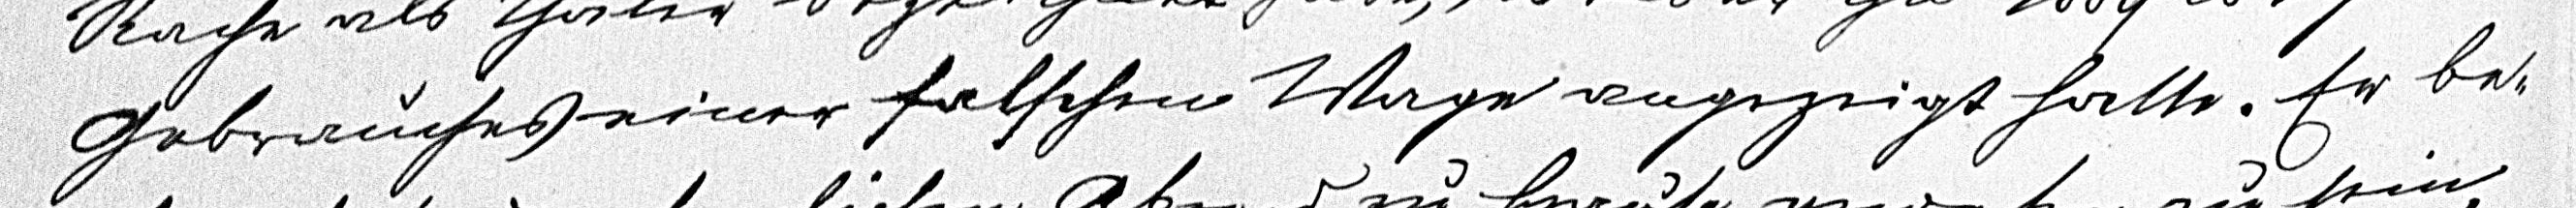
Gebrauches einer falschen Wage angezeigt hatte. Er be¬
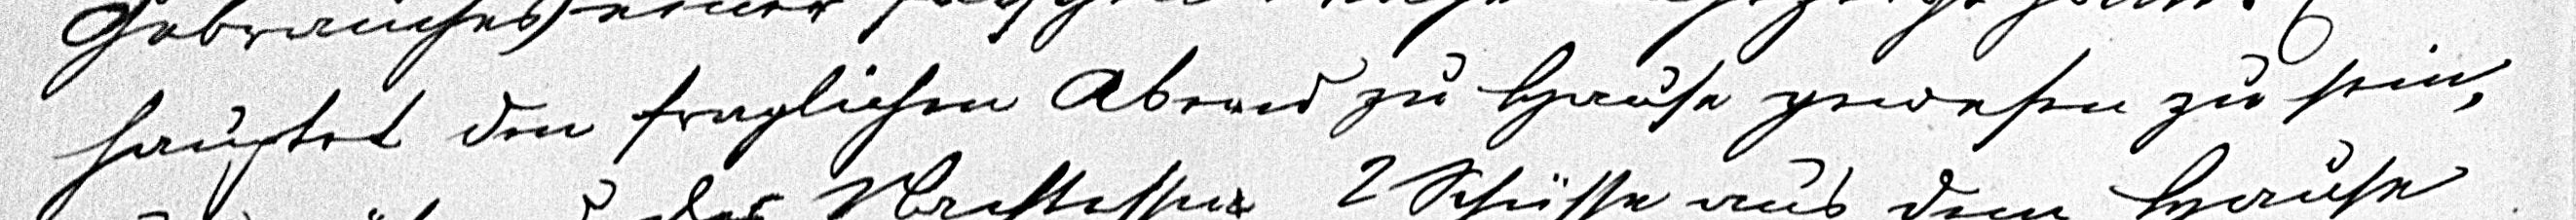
hauptet den fraglichen Abend zu Hause gewesen zu sein,
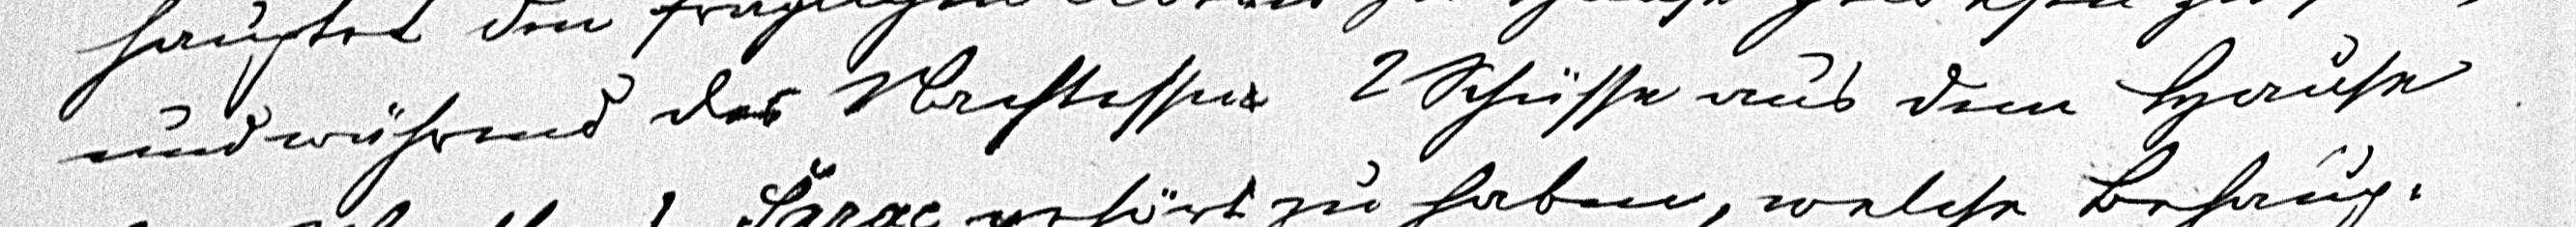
und während des Nachtessen 2 Schüsse aus dem Hause
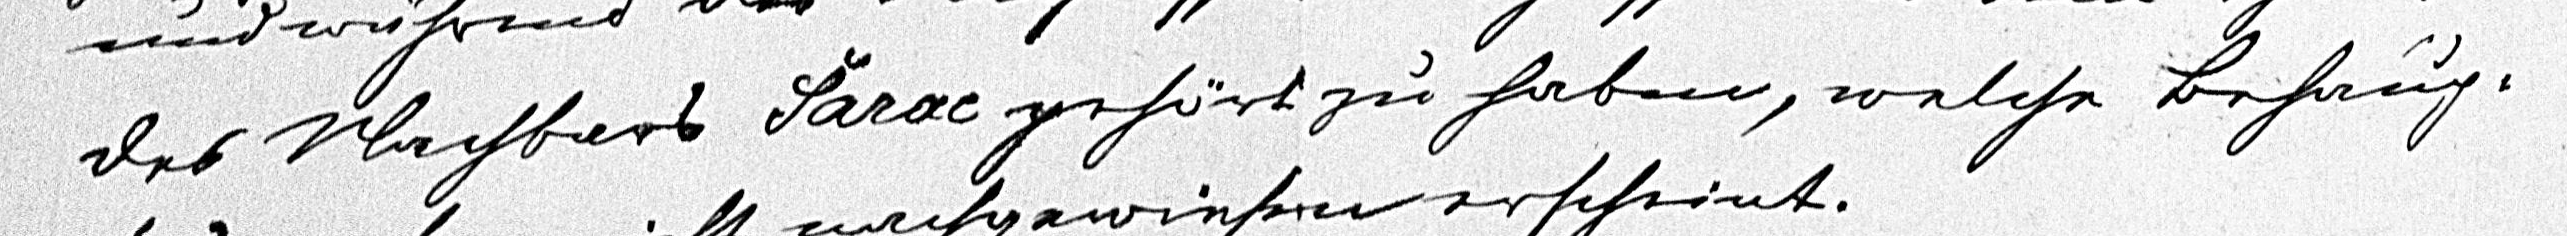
des Nachbars Šarac gehört zu haben, welche Behaup¬
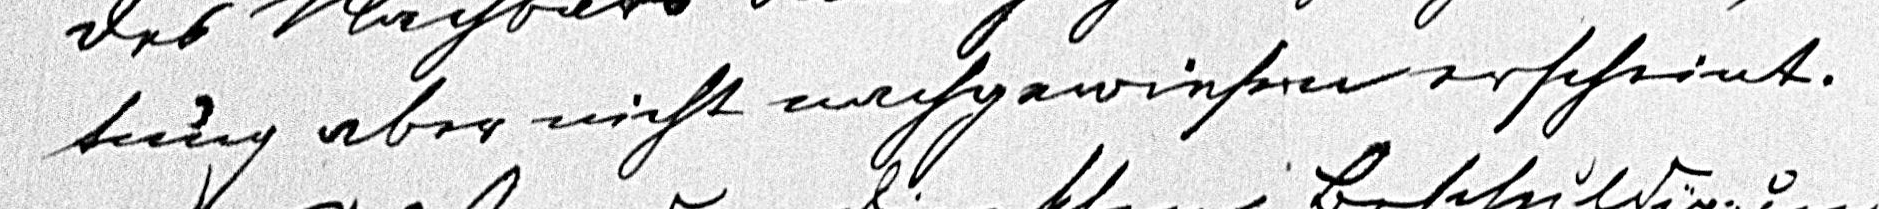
tung aber nicht nachgewiesen erscheint.
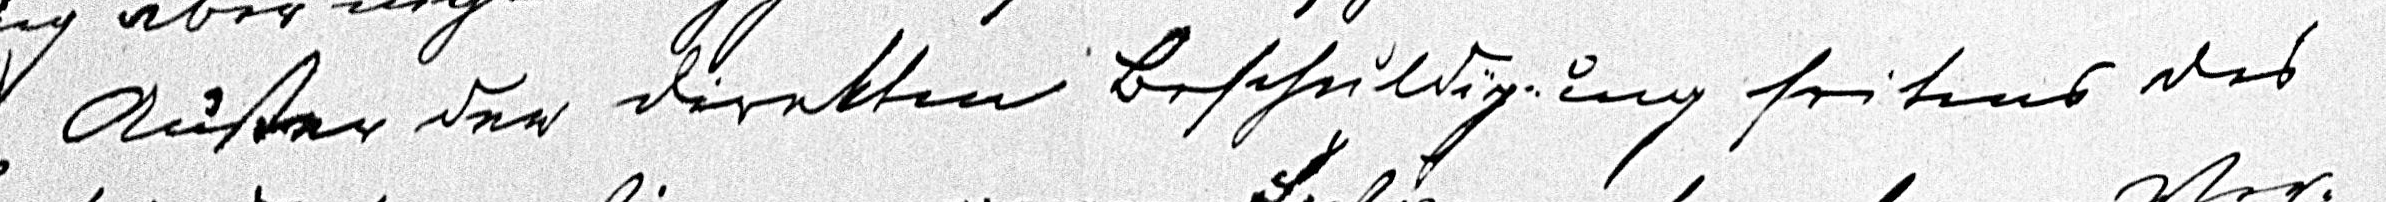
Außer der direkten Beschuldigung seitens des
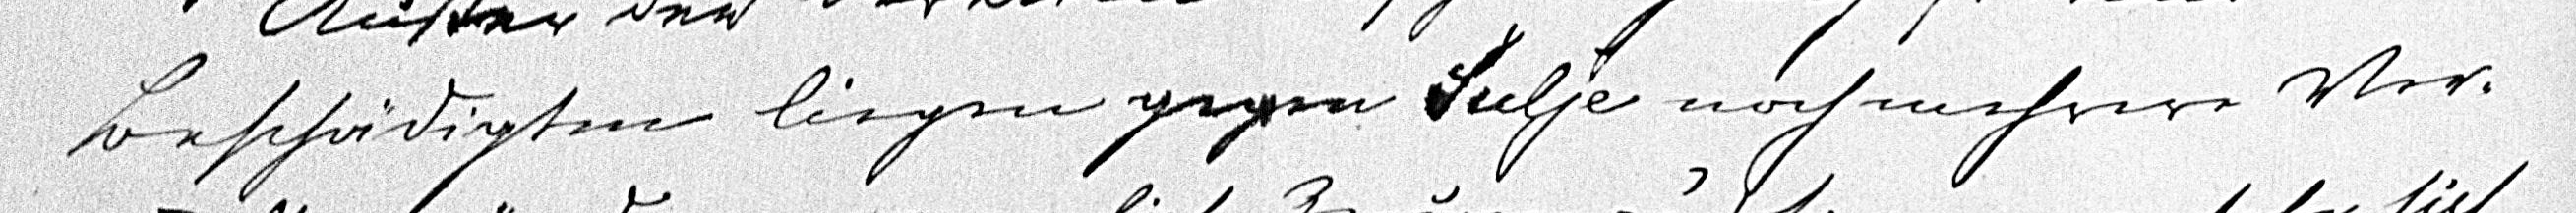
Beschädigten liegen gegen Šulje noch mehrere Ver¬
